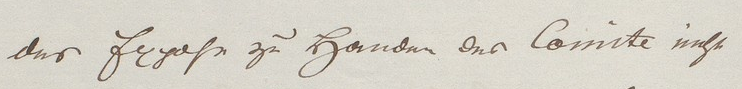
des Expose zu Handen des Comite nicht
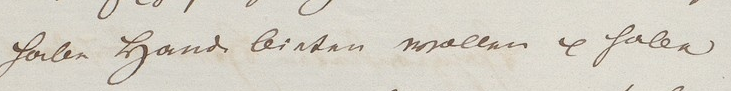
habe Hand bieten wollen & habe
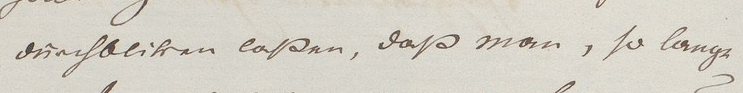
durchbliken laßen, daß man, so lange
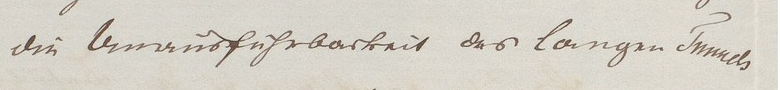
die Unausführbarkeit des langen Tunnels
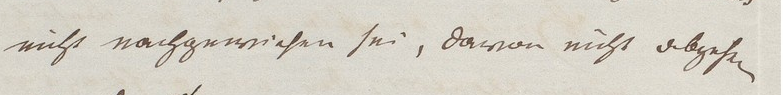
nicht nachgewiesen sei, davon nicht abgehen
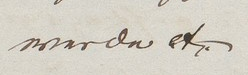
werde etc. –
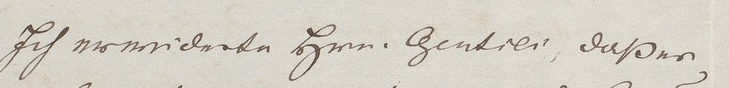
Ich erwiderte Hrn. Gentili, daß es
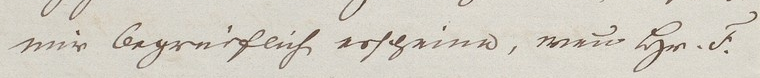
mir begreiflich erscheine, wenn Hr. F.
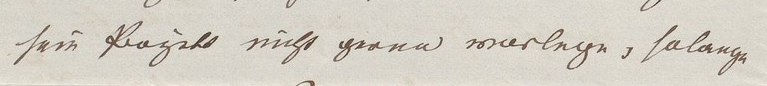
sein Projekt nicht gerne vorlege, solange
